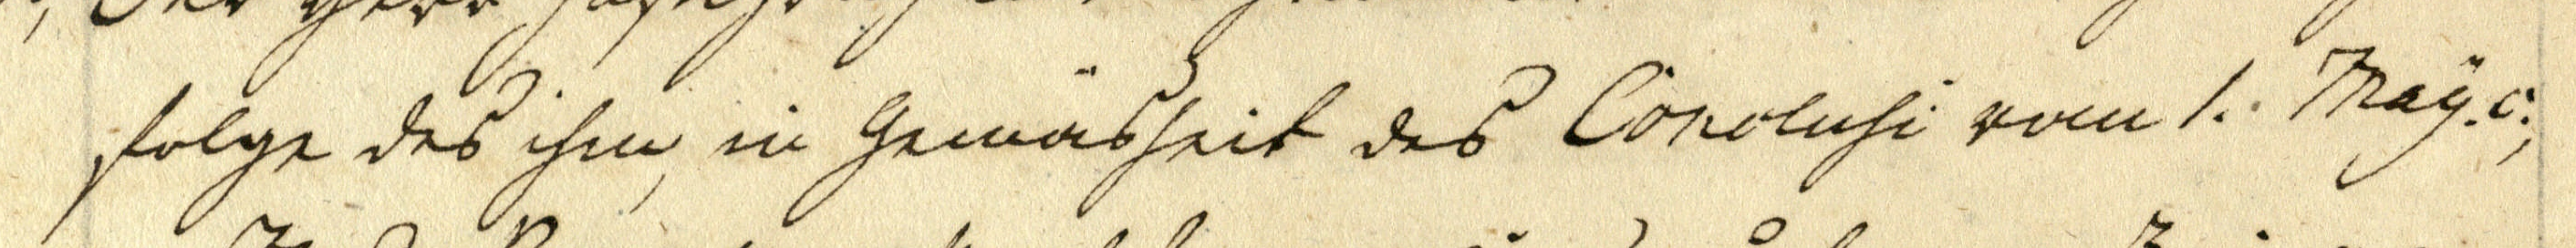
folge des ihm in Gemäsheit des Conclusi vom 1. Maÿ. c.,
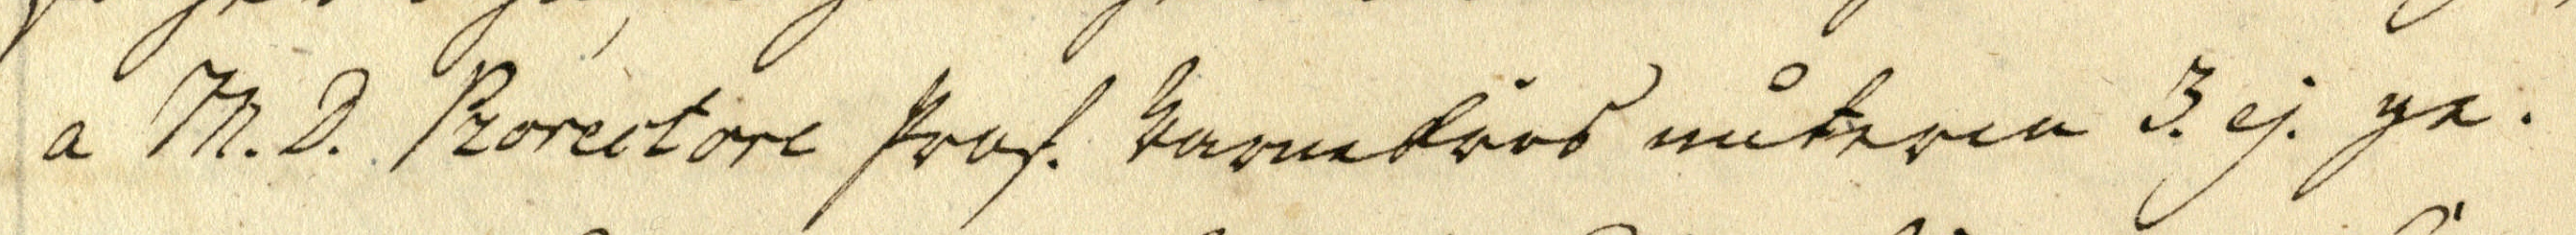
a. M. D. Prorectore Prof. Warnekros unterm 3. ej. ge¬
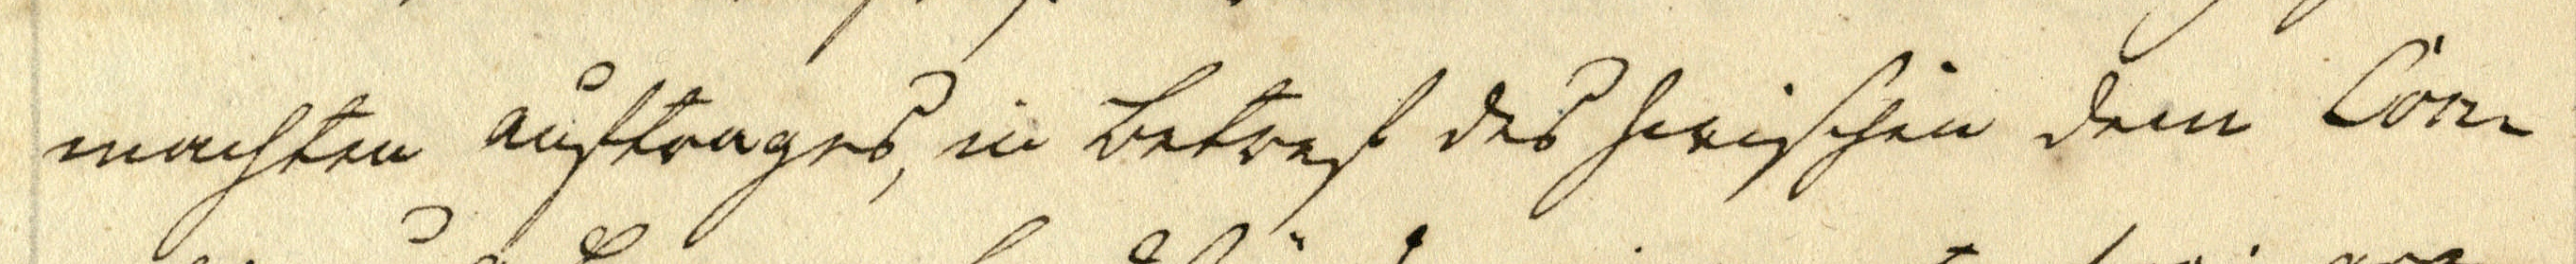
machten Auftrages, in Betref des zwischen dem Con¬
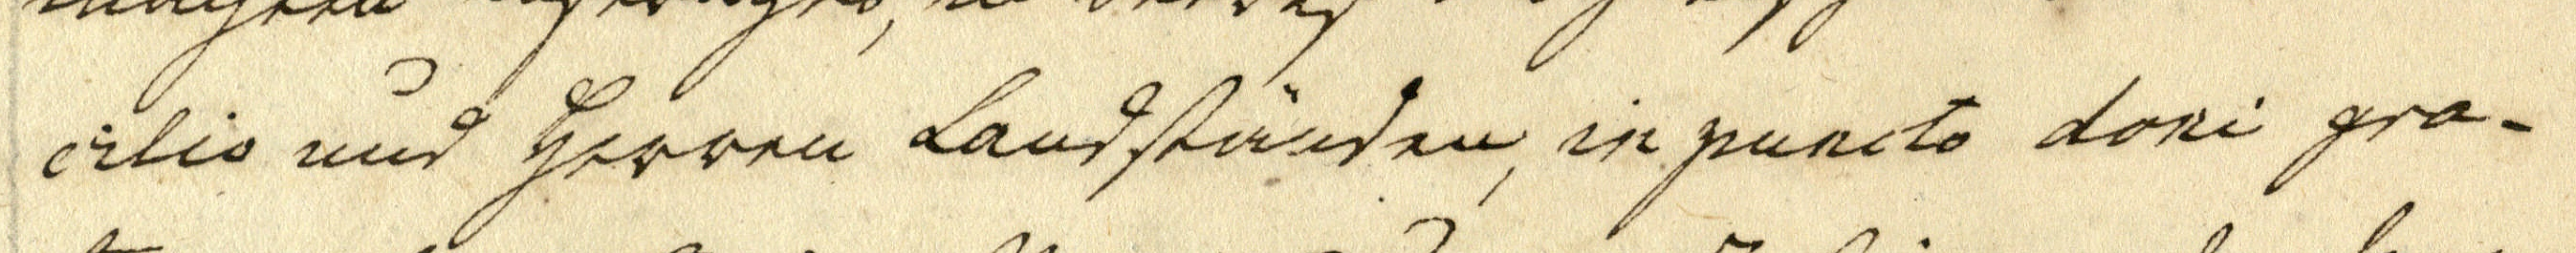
cilio und Herren Landständen in puncto doni gra¬
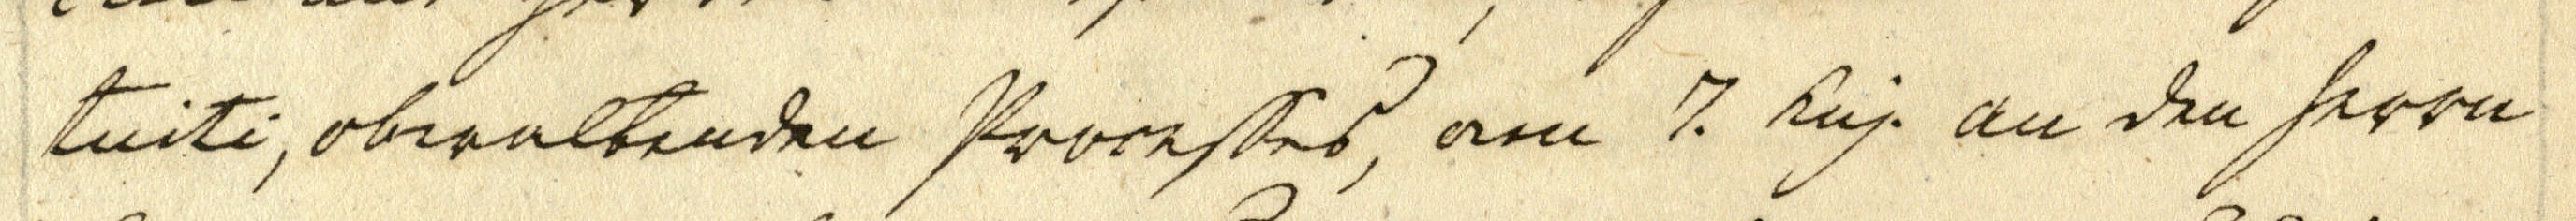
tuiti, obwaltenden Processes, am 7. huj. an den herrn
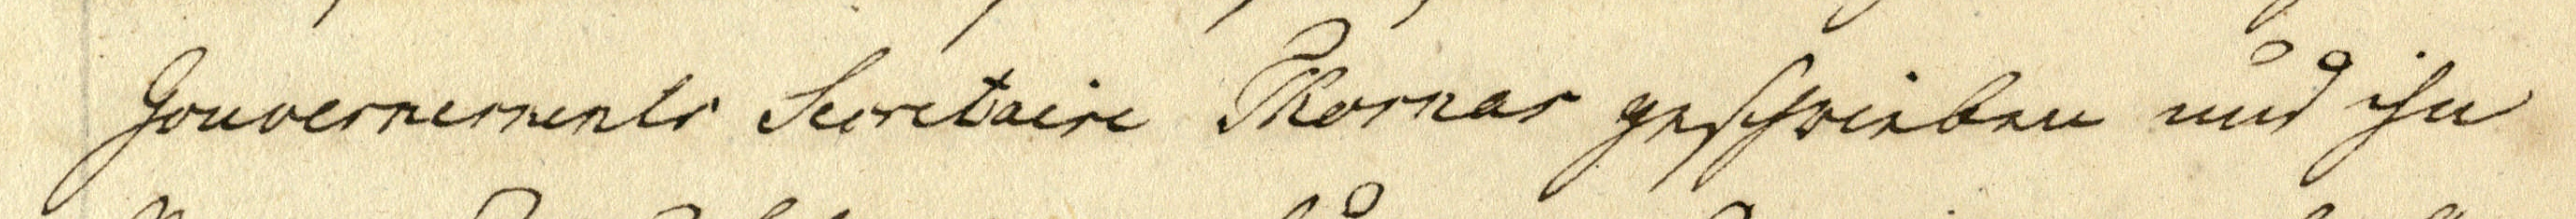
Gouvernements Secretaire Thomas geschrieben und ihn
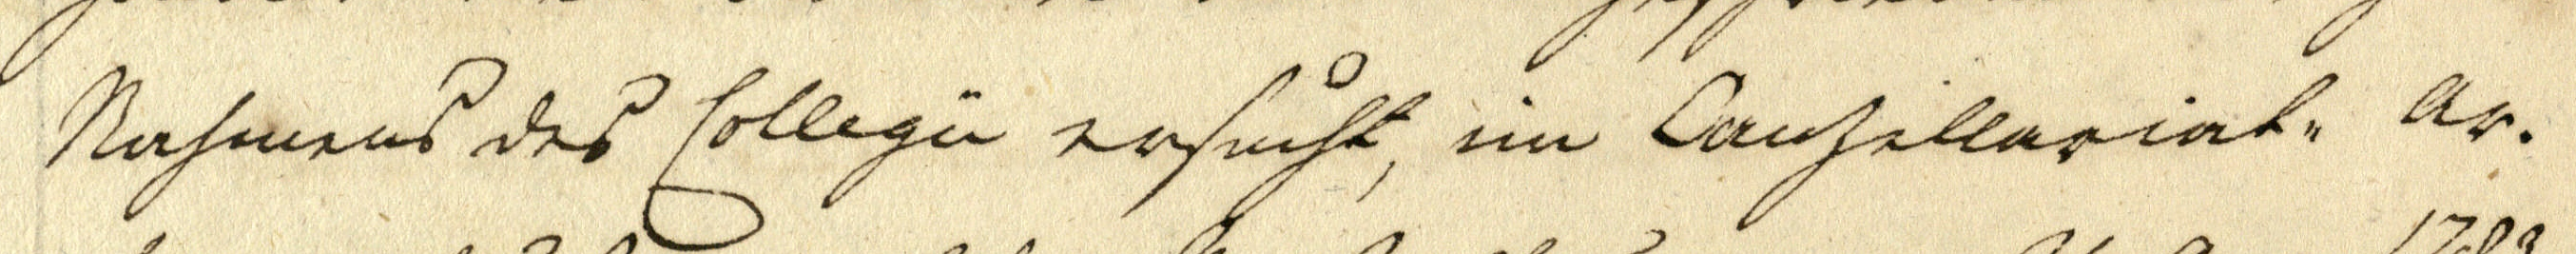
Nahmens des Collegii ersucht, im Canzellariat Ar¬
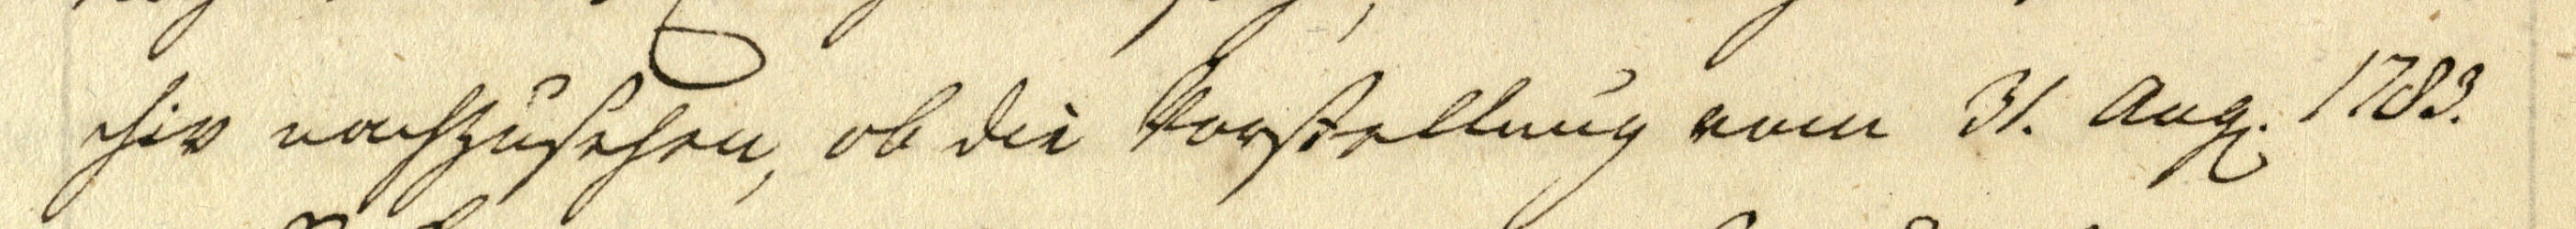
chiv nachzusehen, ob die Vorstellung vom 31. Aug. 1783
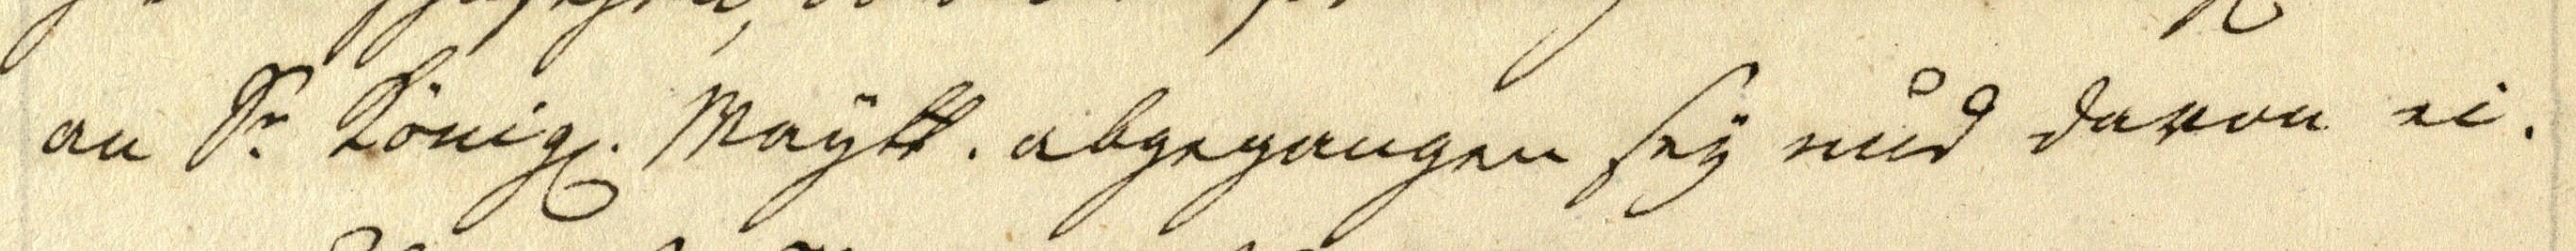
an Sr. Königl. Maÿtt. abgegangen seÿ und davon ei¬
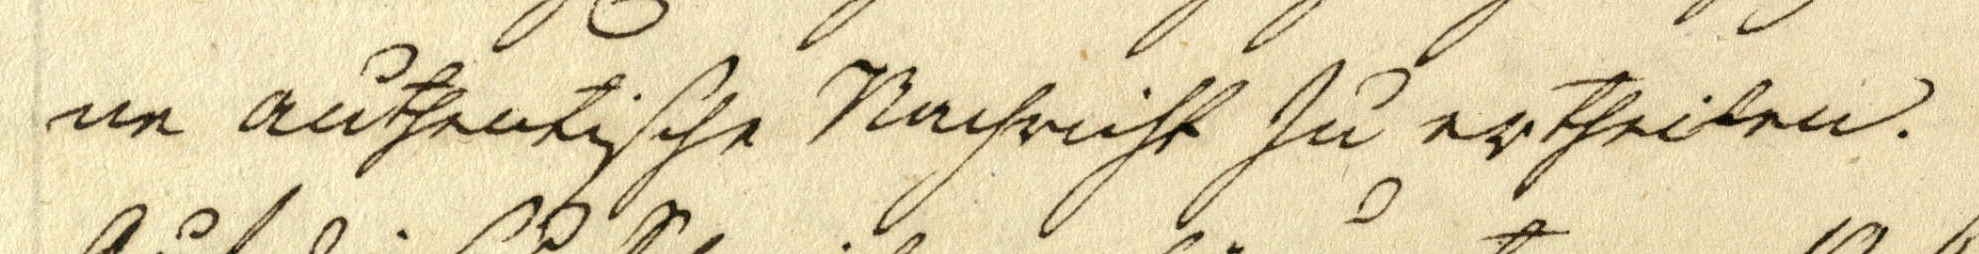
ne authentische Nachricht zu ertheilen.
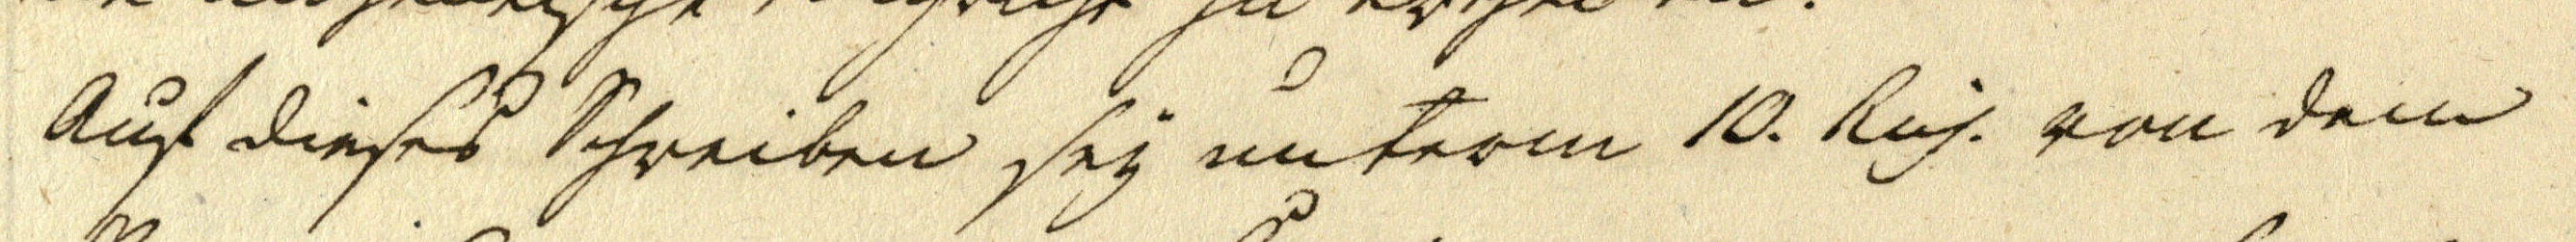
Auf dieses Schreiben seÿ unterm 10. huj. von dem
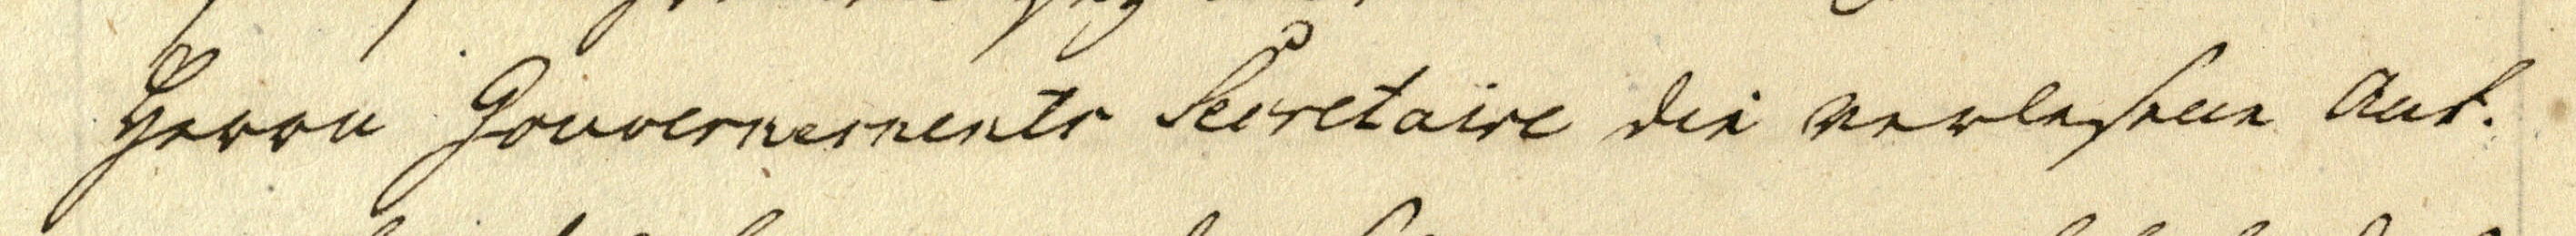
Herrn Gouvernements Secretaire die verlesene Ant¬
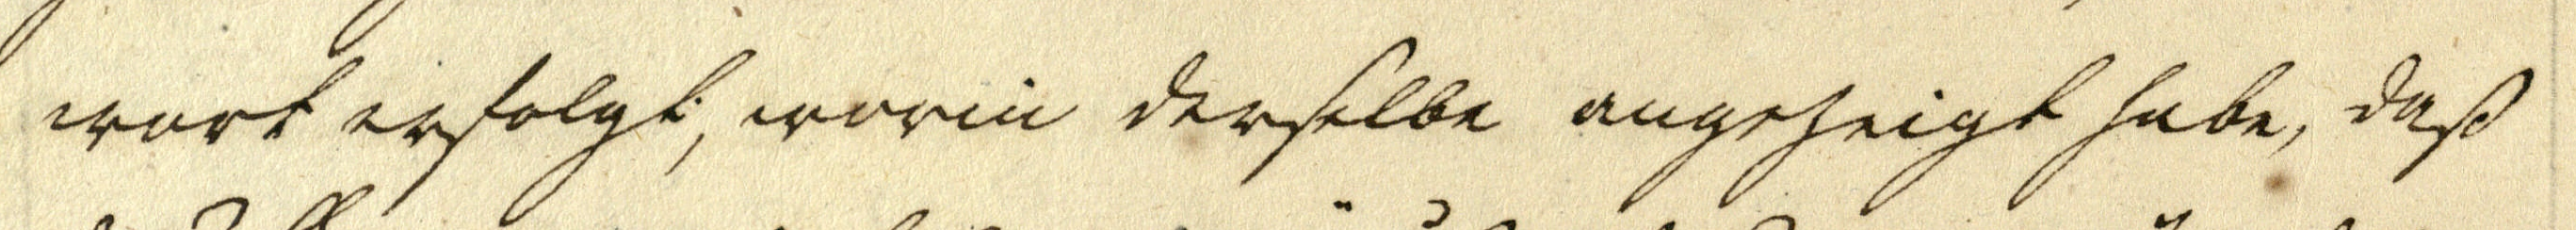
wort erfolgt, worin derselbe angezeigt habe, daß
